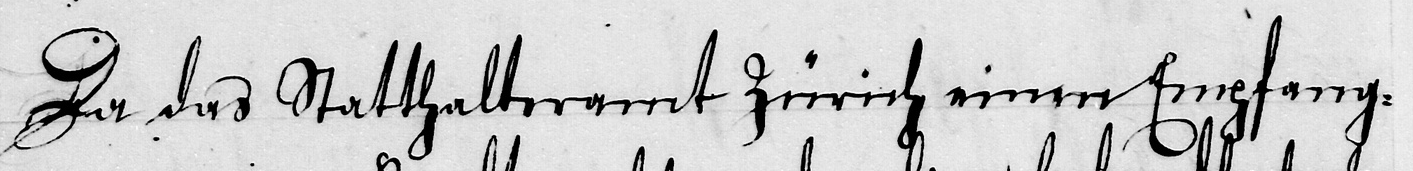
Da das Statthalteramt Zürich einen Empfang¬
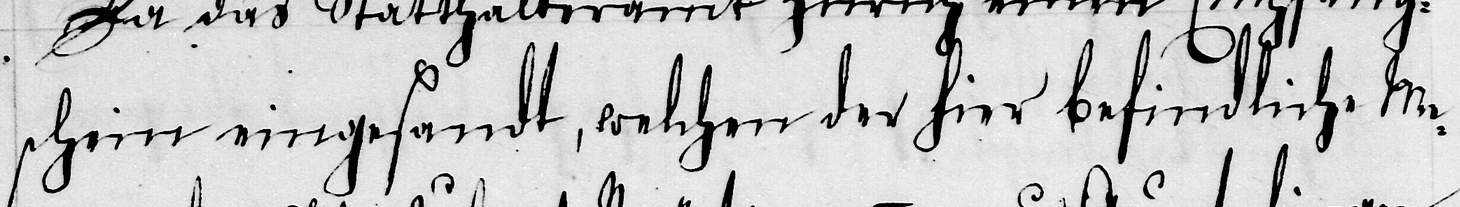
schein eingesandt, welchen der hier befindlichen M¬
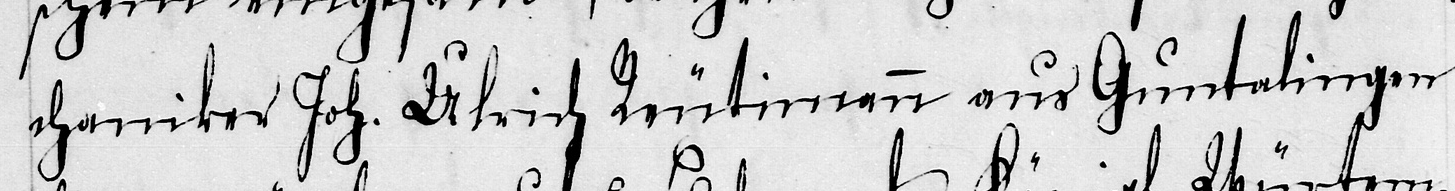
echaniker Joh Ulrich Reutimann aus Guntalingen
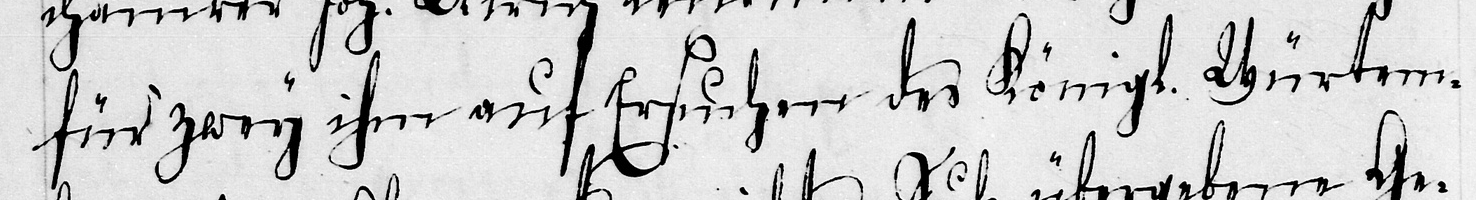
für zwey ihm auf Ersuchen des Königl. Würtem¬
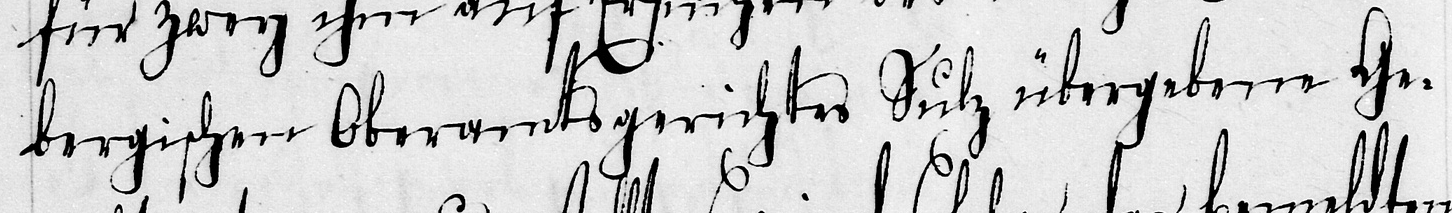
bergischen Oberamtsgerichtes Sulz übergebene Ge¬
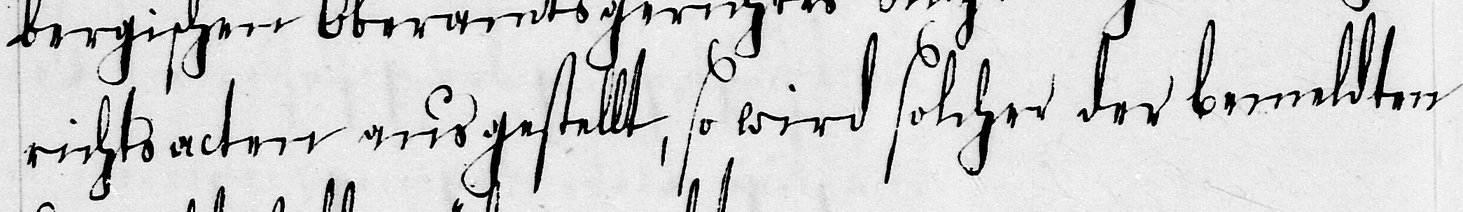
richtsacten ausgestellt, so wird solcher der bemeldten
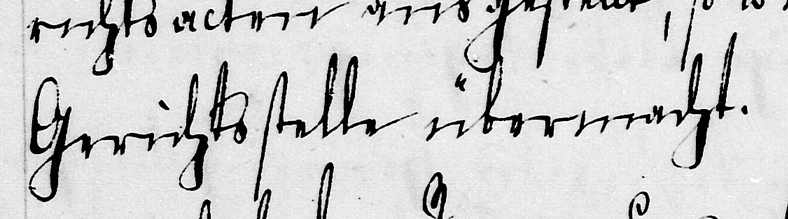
Gerichtsstelle übermacht.
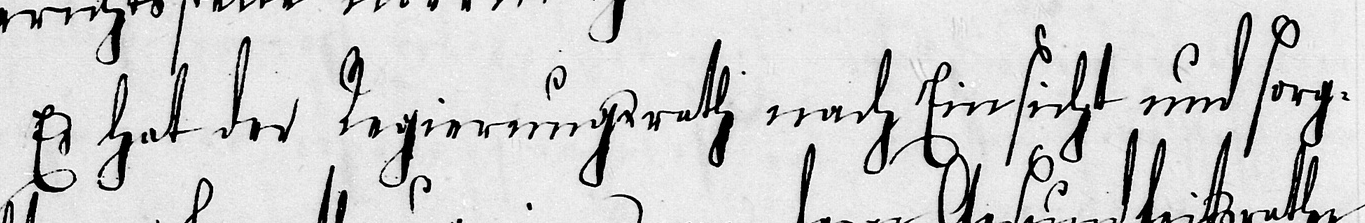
Es hat der Regierungsrath nach Einsicht und sor¬
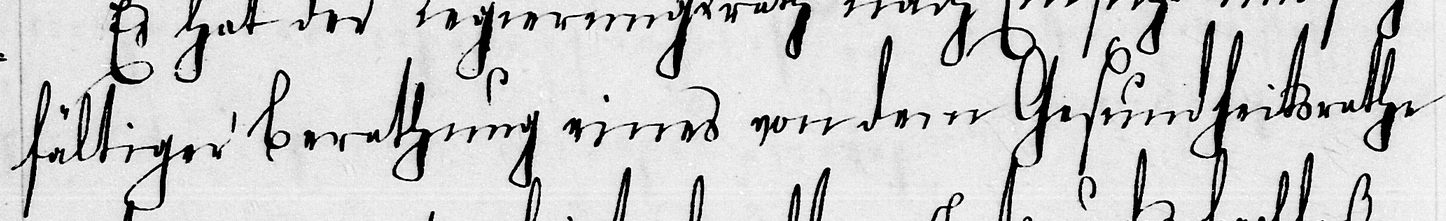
gfältiger Berathung eines von dem Gesundheitsrathe
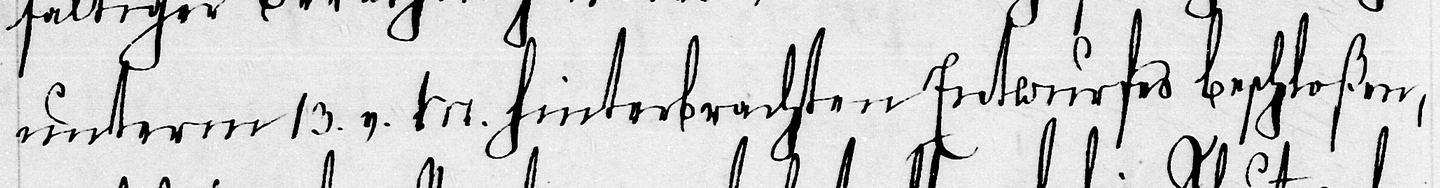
unterm 13. v. M. hinterbrachten Entwurfes beschloßen,
